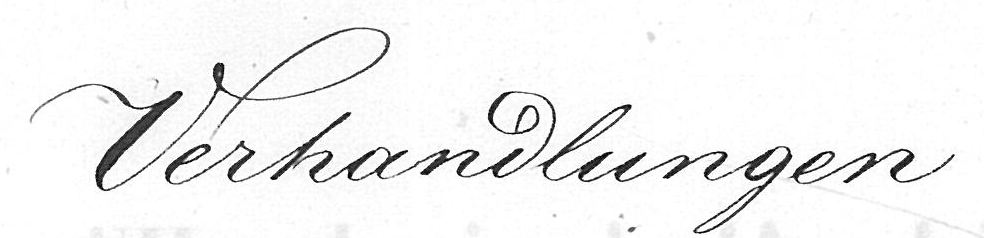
Verhandlungen
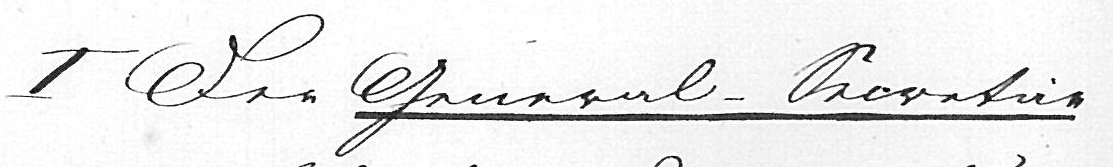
I Der General-Secretär
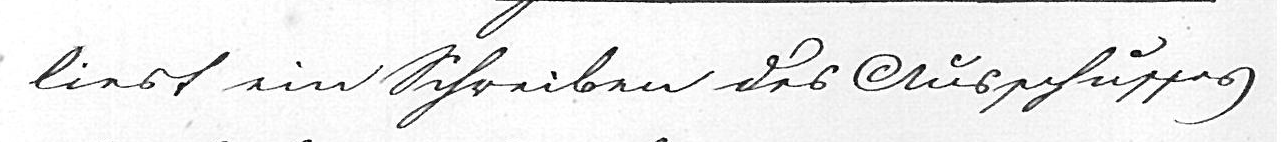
liest ein Schreiben des Ausschusses
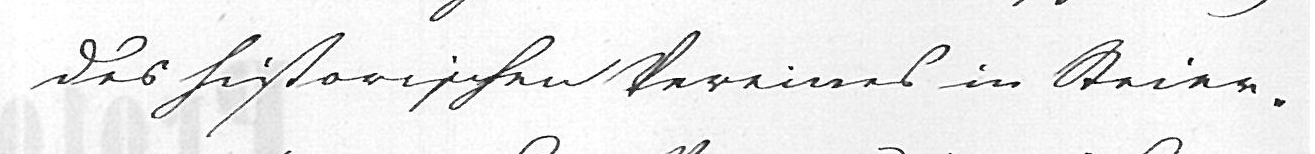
des historischen Vereines in Steier-
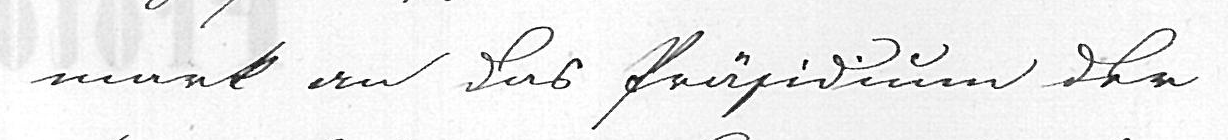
mark an das Präsidium der
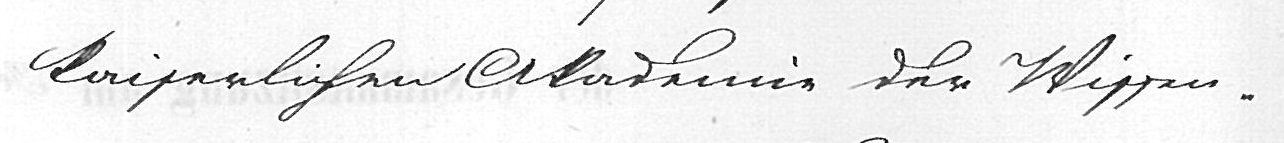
kaiserlichen Akademie der Wissen-
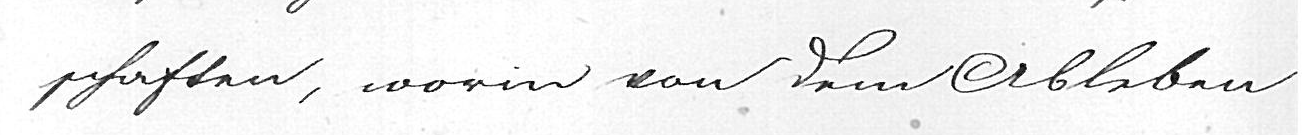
schaften, worin von dem Ableben
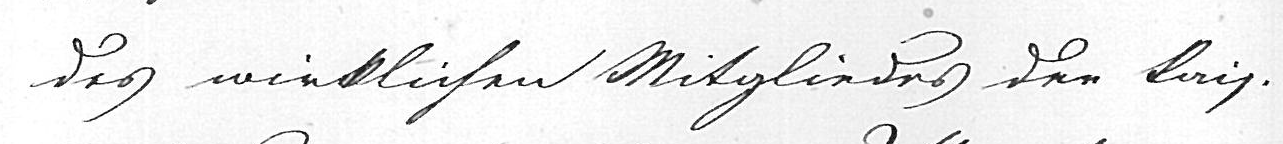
des wirklichen Mitgliedes der kais.
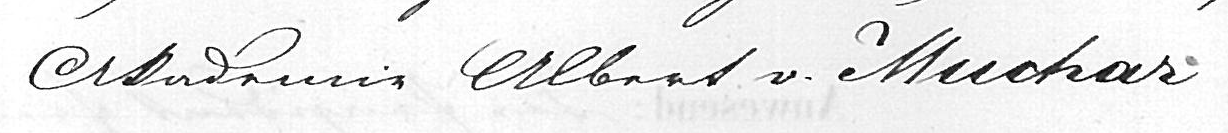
Akademie Albert v. Muchar
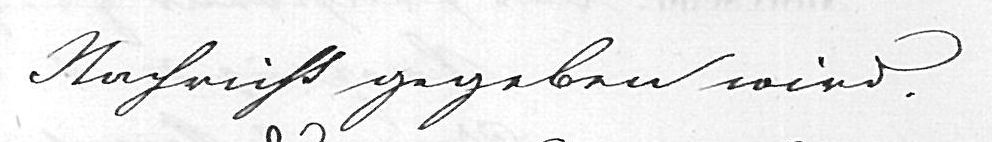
Nachricht gegeben wird.
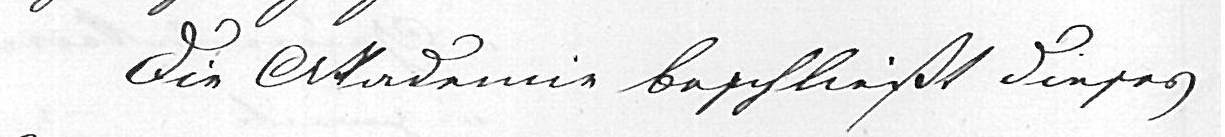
Die Akademie beschließt dieses
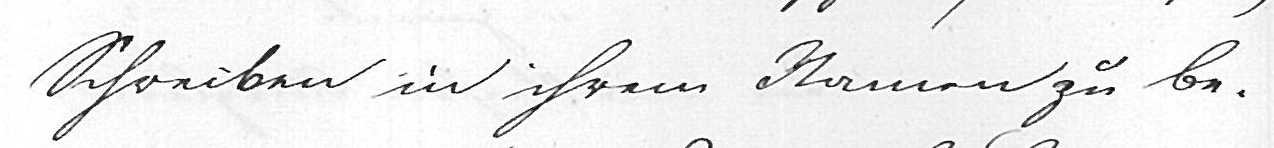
Schreiben in ihrem Namen zu be-
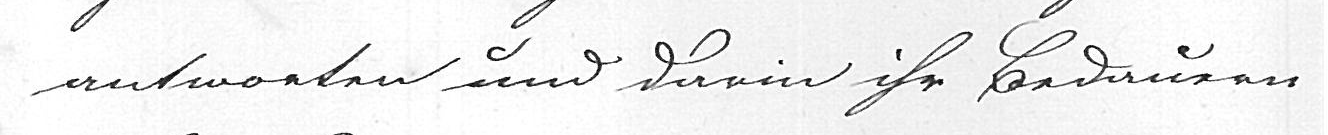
antworten und darin ihr Bedauern
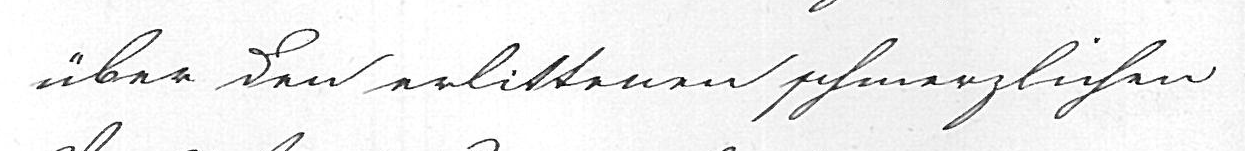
über den erlittenen schmerzlichen
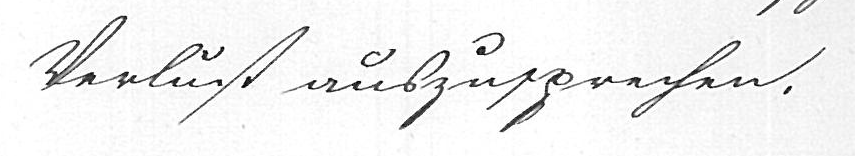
Verlust auszusprechen.
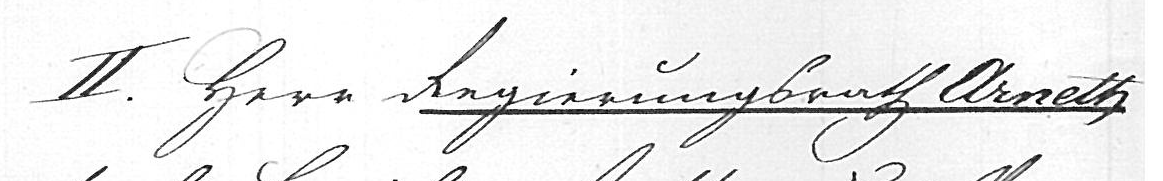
II. Herr Regierungsrath Arneth
